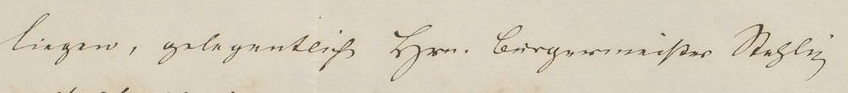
liegen, gelegentlich Hrn. Bürgermeister Stehlin
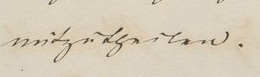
mitzutheilen.
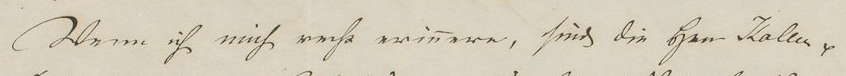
Wenn ich mich recht erinnere, sind die Hrn. Koller &
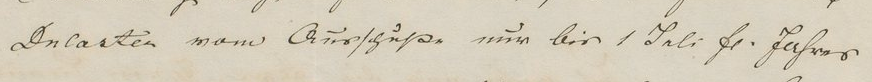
Du Coster vom Ausschuße nur bis 1 Juli fl. Jahres
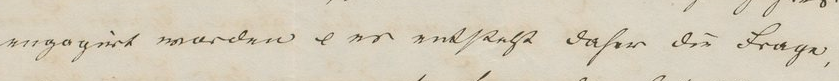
engagirt worden & es entsteht daher die Frage,
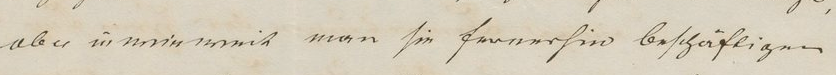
ob & inwieweit man sie fernerhin beschäftigen
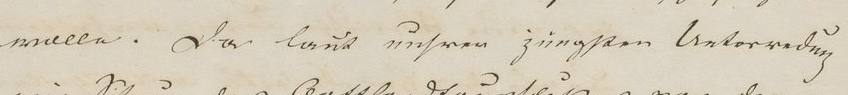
wolle. Da laut unsrer jüngsten Unterredung
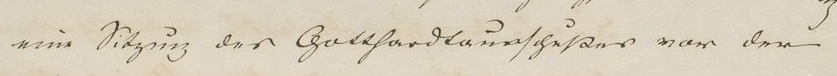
eine Sitzung des Gotthardtausschußes vor der
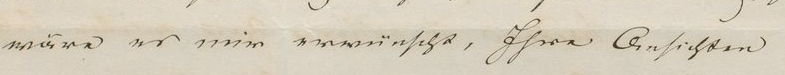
wäre es mir erwünscht, Ihre Ansichten
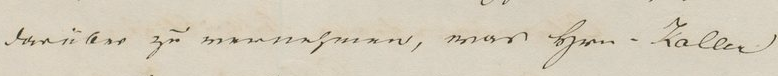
darüber zu vernehmen, was Hrn. Koller
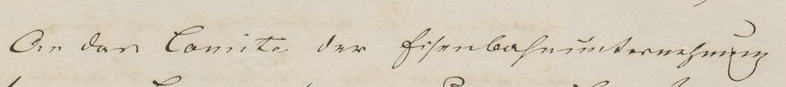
An das Comite der Eisenbahnunternehmung
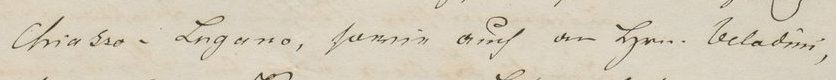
Chiasso–Lugano, sowie auch an Hrn. Veladini,
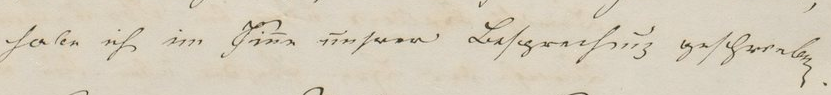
habe ich im ISinne unsrer Besprechung geschrieben.
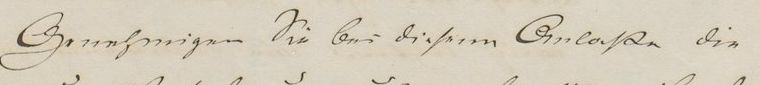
Genehmigen Sie bei diesem Anlaße die
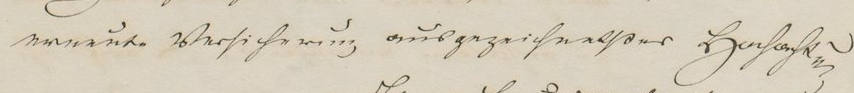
erneute Versicherung ausgezeichnetster Hochachtung
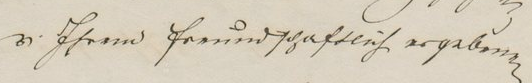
v. Ihrem freundschaftlich ergebenen
